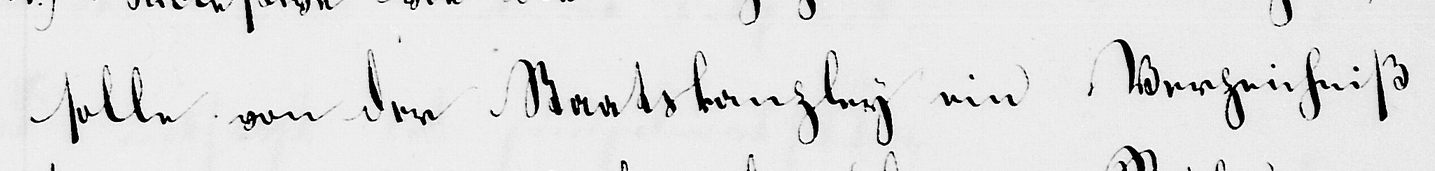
solle von der Staatskanzley ein Verzeichniß
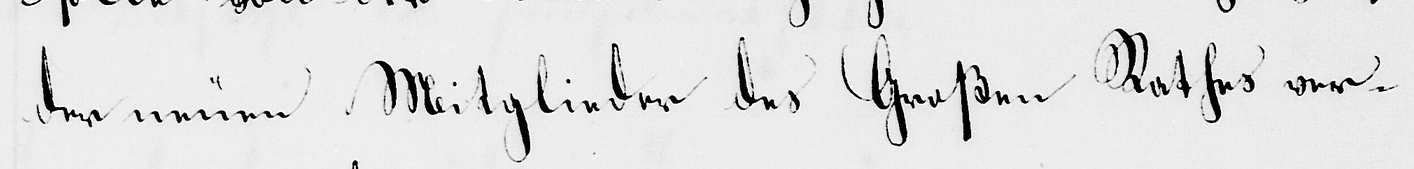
der neuen Mitglieder des Großen Rathes ver¬
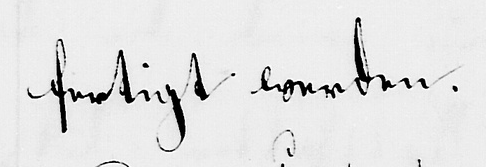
fertigt werden.
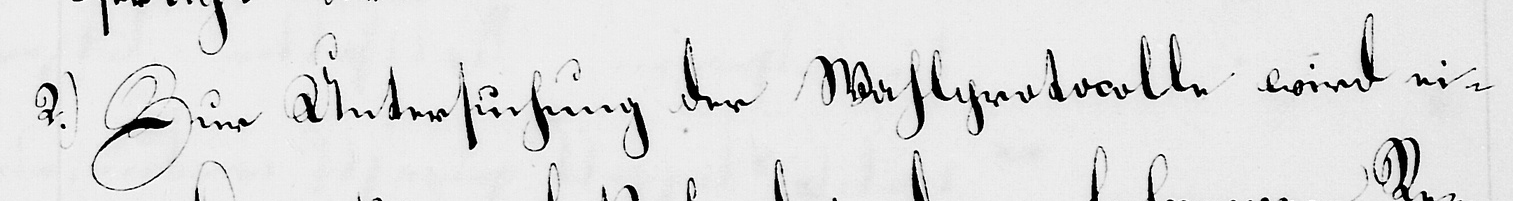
2.) Zur Untersuchung der Wahlprotocolle wird ei¬
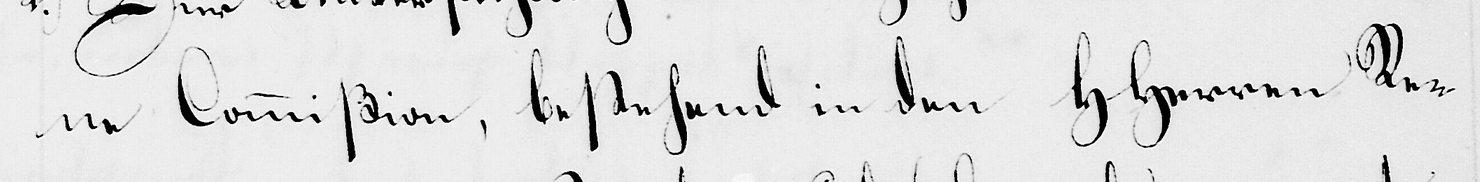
ne Commißion, bestehend in den HHerren Re¬
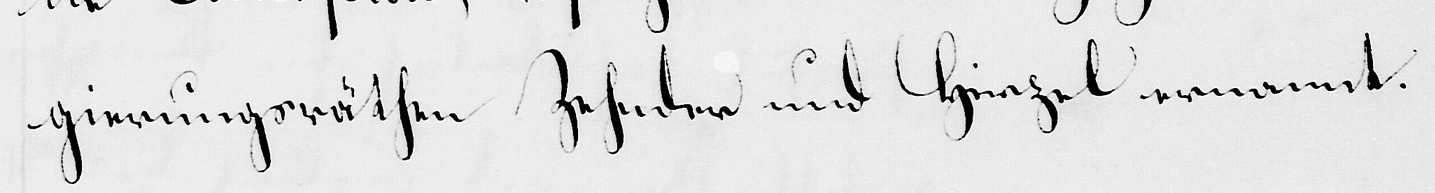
gierungsräthen Zehnder und Hirzel ernannt.
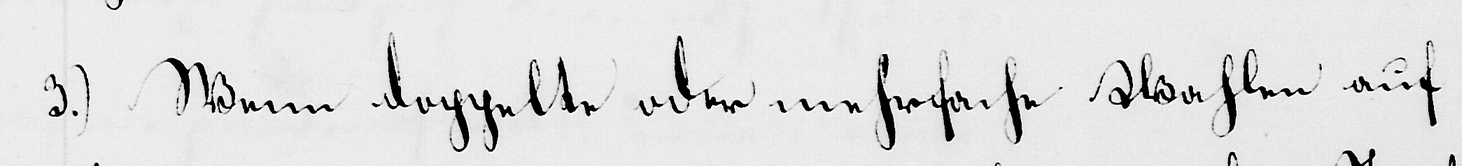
3.) Wenn doppelte oder mehrfache Wahlen auf
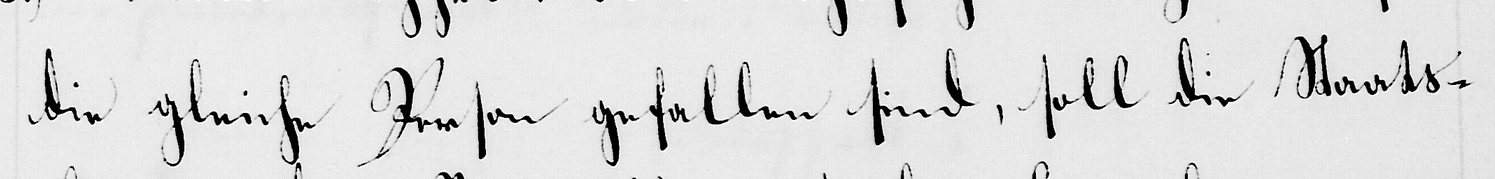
die gleiche Person gefallen sind, soll die Staats¬
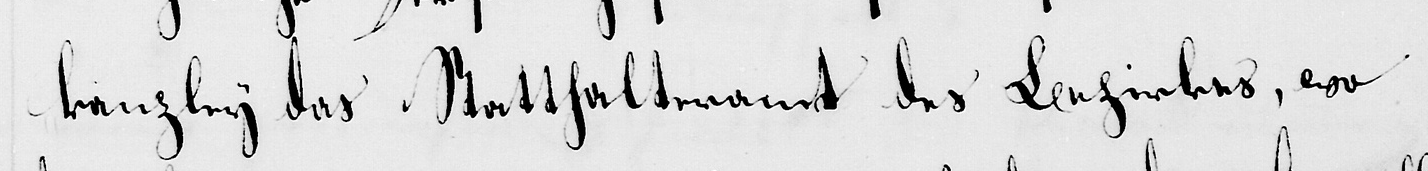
kanzley das Statthalteramt des Bezirkes, wo
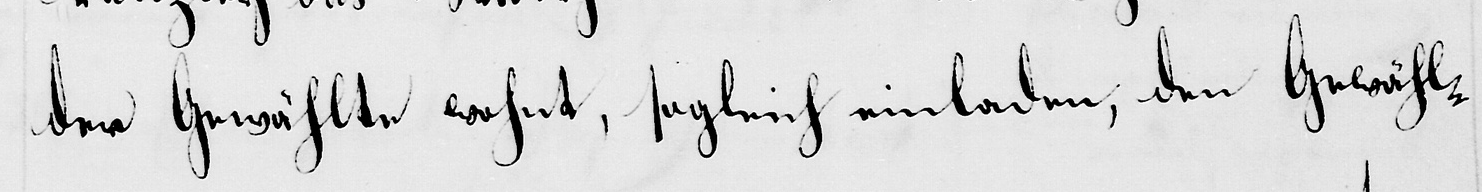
der Gewählte wohnt, sogleich einladen, den Gewähl-
